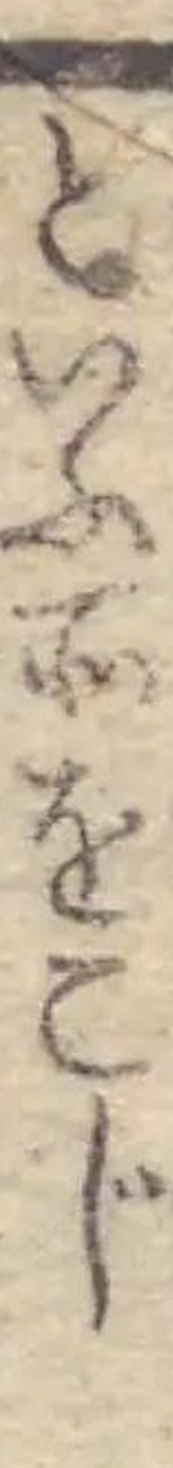といふ所をこじ
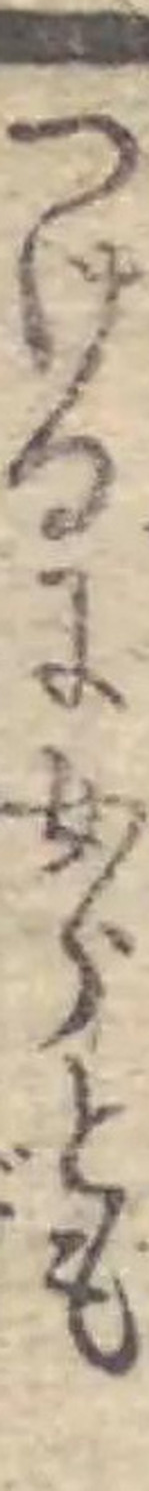つけるに女郎とも
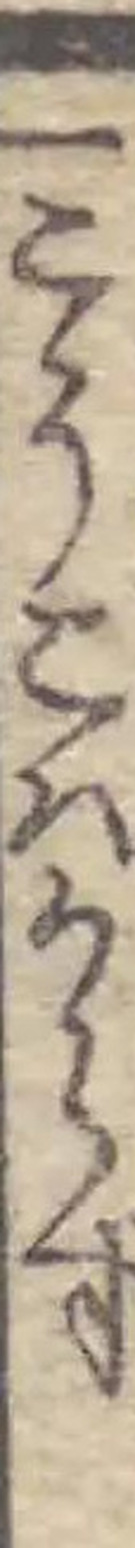一こうこはがらず
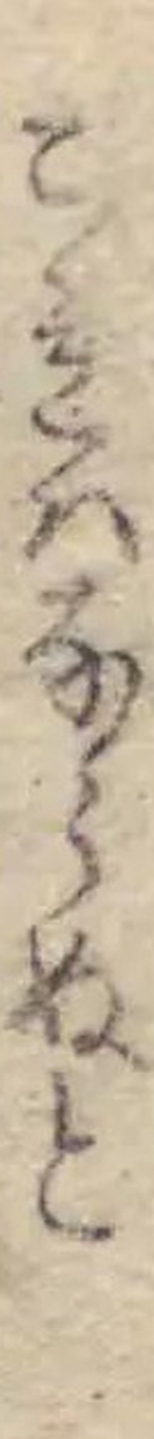これはならぬと
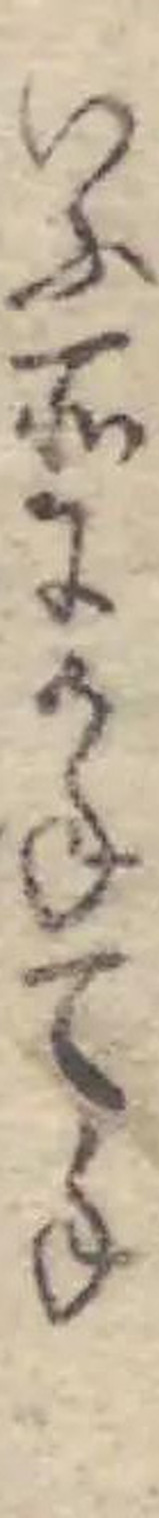いふ所にかねて手
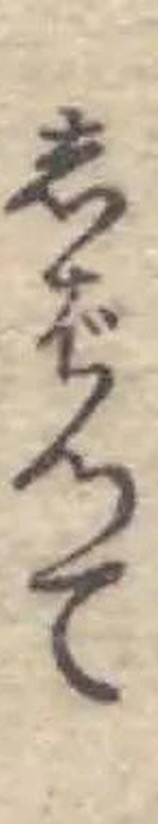しばつて
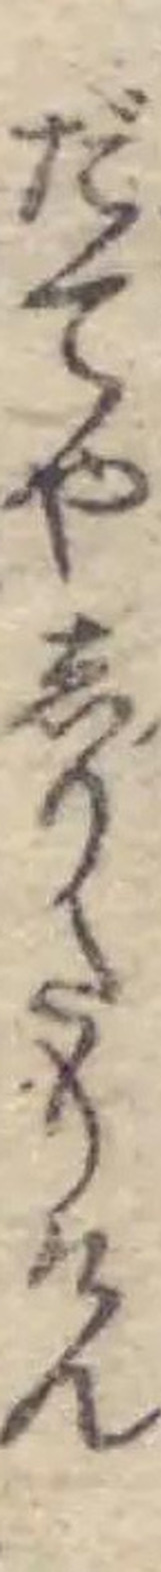だてやしりたりけん
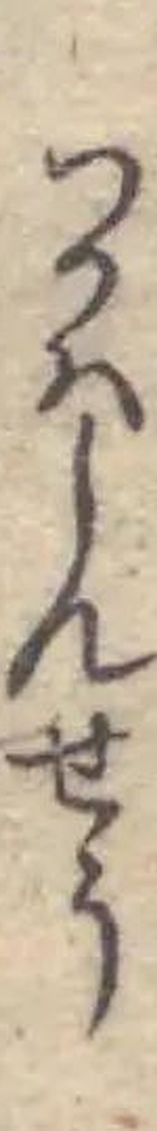つかはしんせう
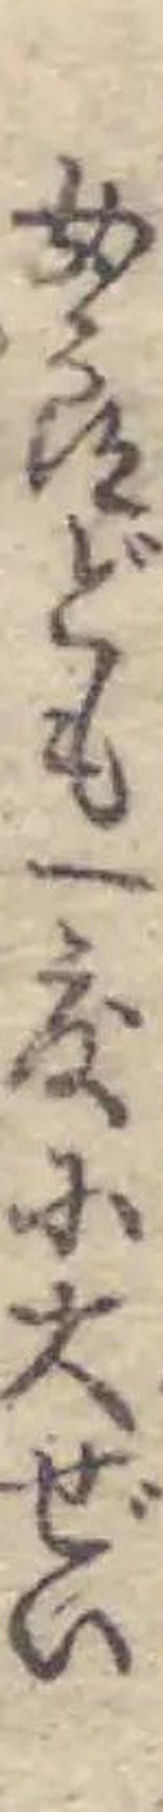女郎ども一度に大ぜい
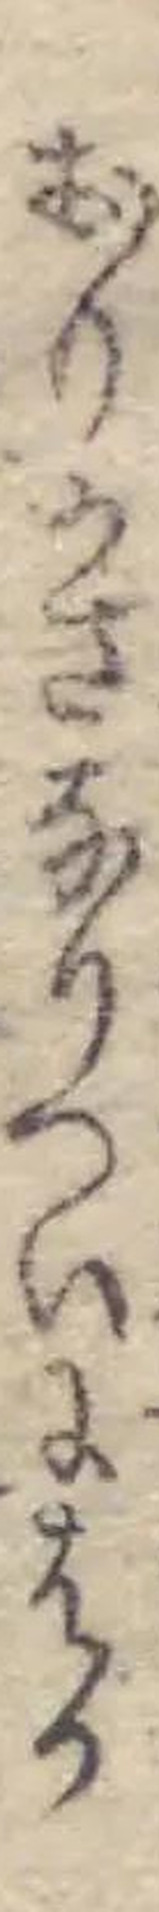おりかさなりついにはか
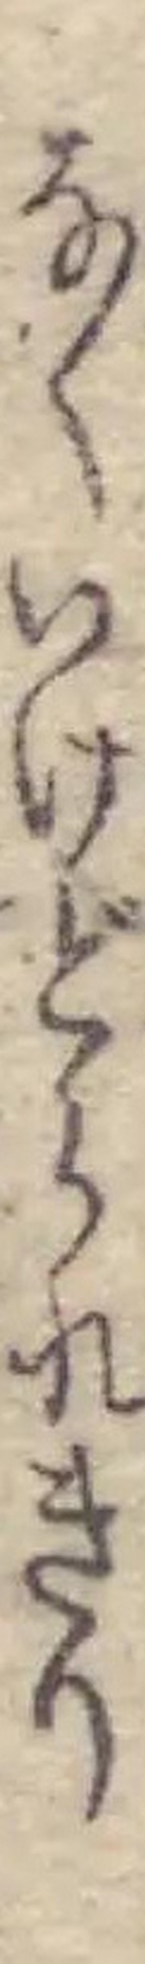なくいけどられきり
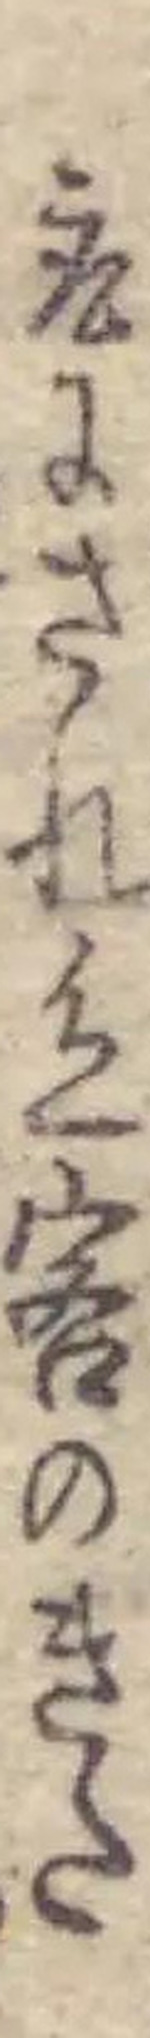取にされ色客のきた
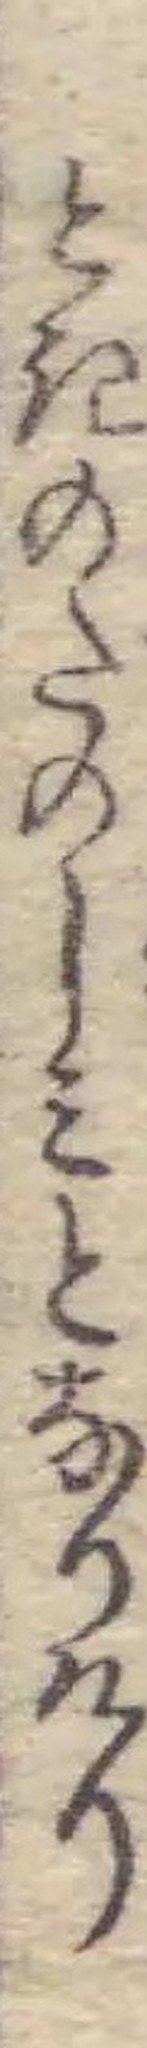ときのたのしみとなりけり
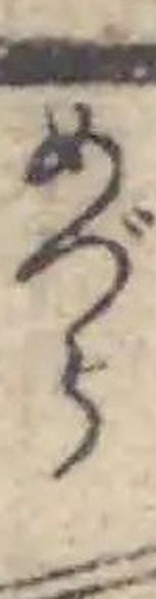めづら
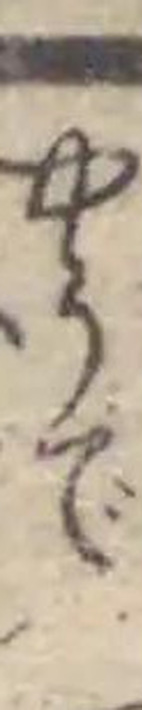やうで
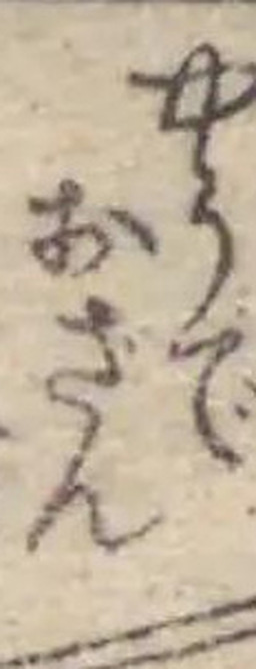おざん
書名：作意妖恐懼感心 2巻
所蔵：国立国会図書館 National Diet Library, JAPAN
